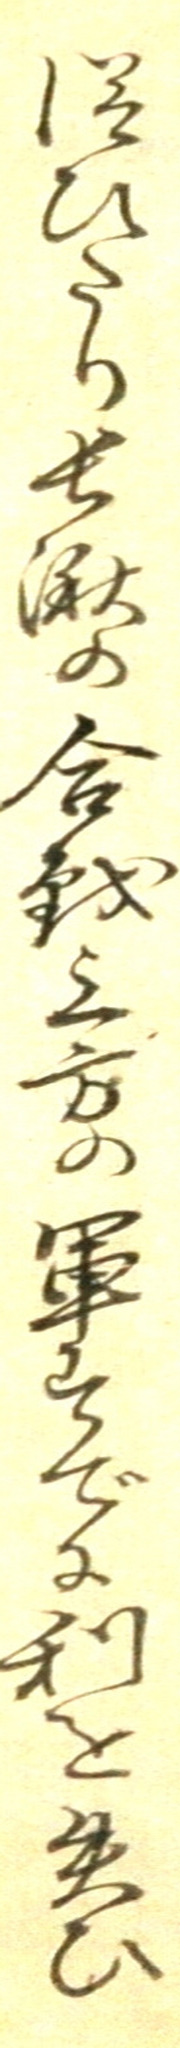従ひたり長湫の合戦上方の軍すでに利を失ひ
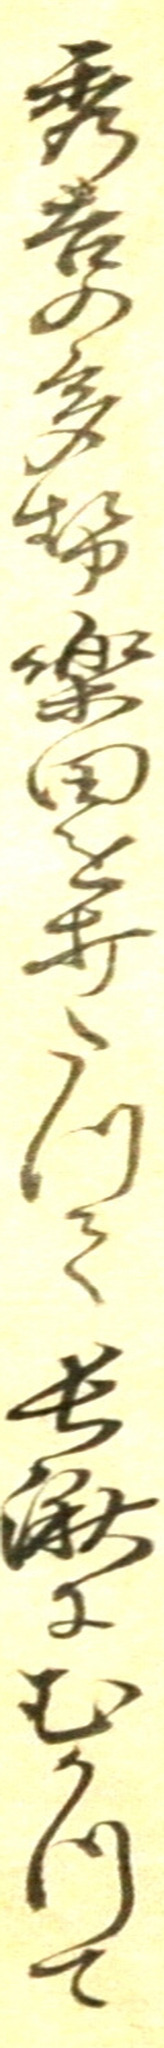秀吉の多勢楽田を打たつて長湫にむかつて
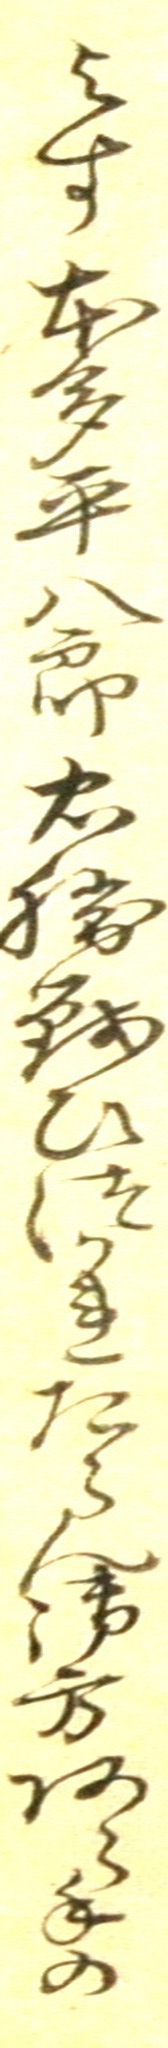よす本多平八郎忠勝戦ひつかれたらん御方あら手の

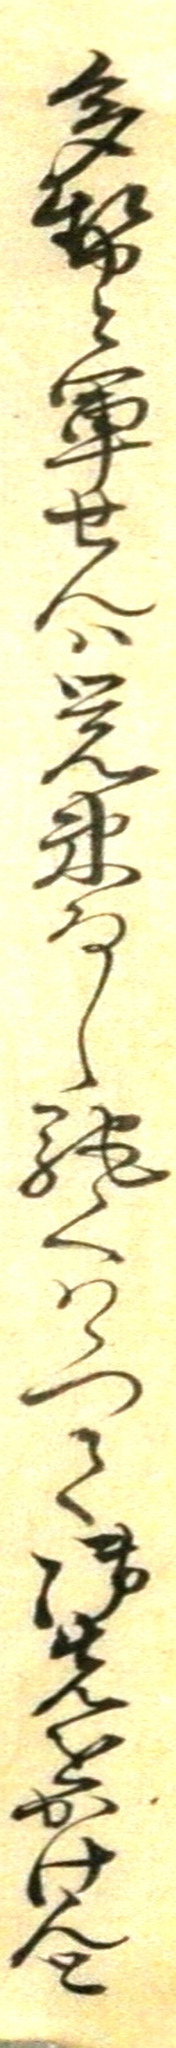多勢と軍せんは覚束なし馳くはゝつて御先をかけんと
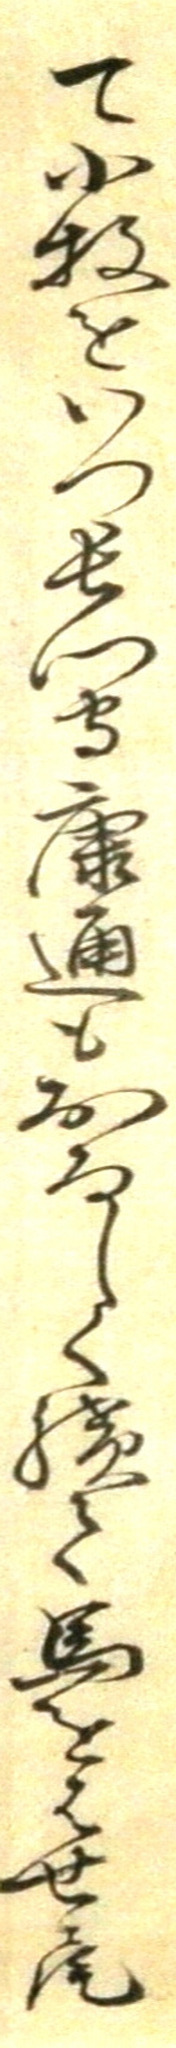て小牧をいつ長門守康通もおなしく続て馬をはせ尾
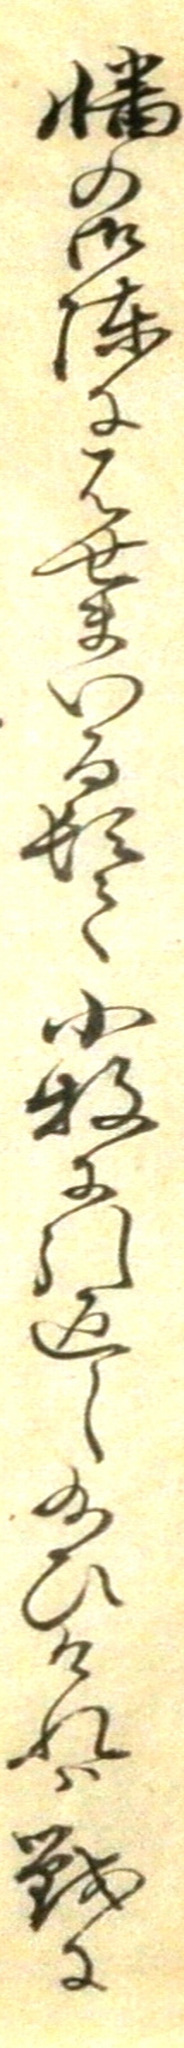幡の御陣にはせまいる頓て小牧に引返し給ひけれは戦に
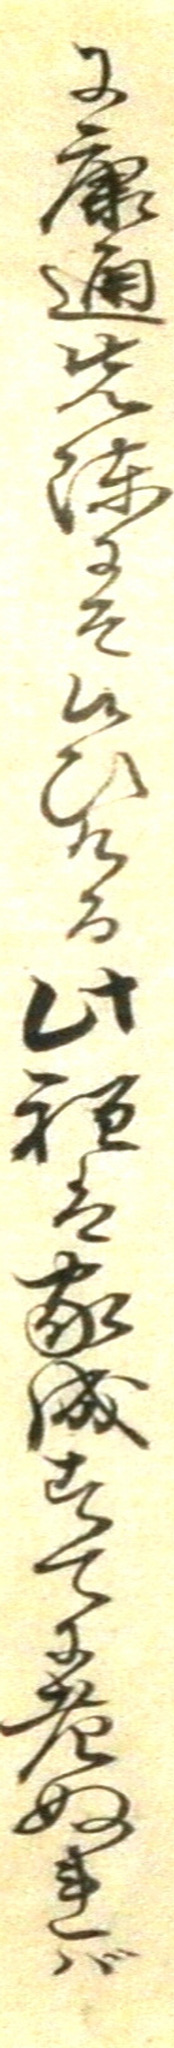に康通先陣にそ候ひける此程は家成すてに老ぬれば
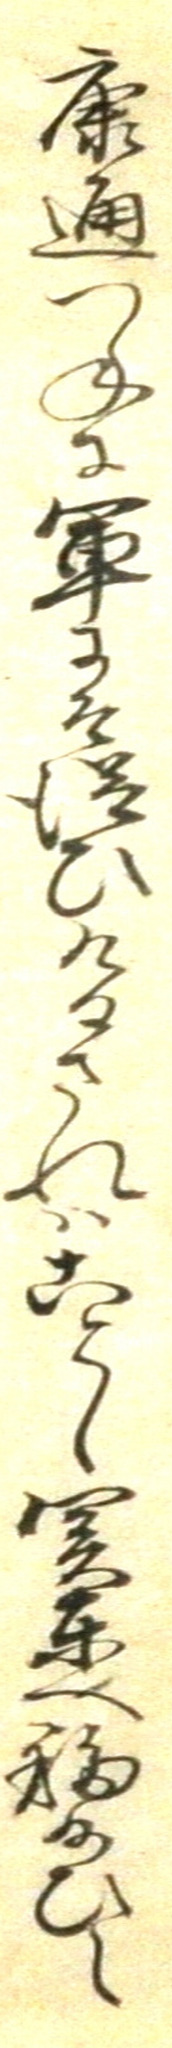康通つねに軍にそ従ひけるされはことし関東へ移給ひし
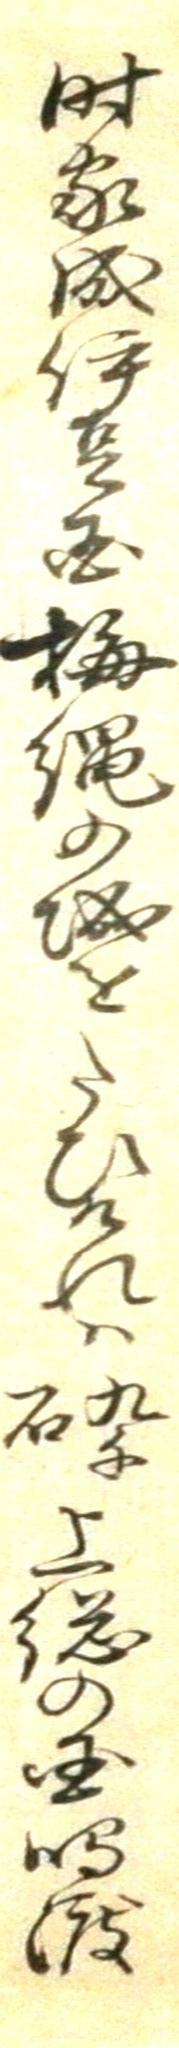時家成伊豆国梅縄の城をたひけれは九千石上総の国鳴渡
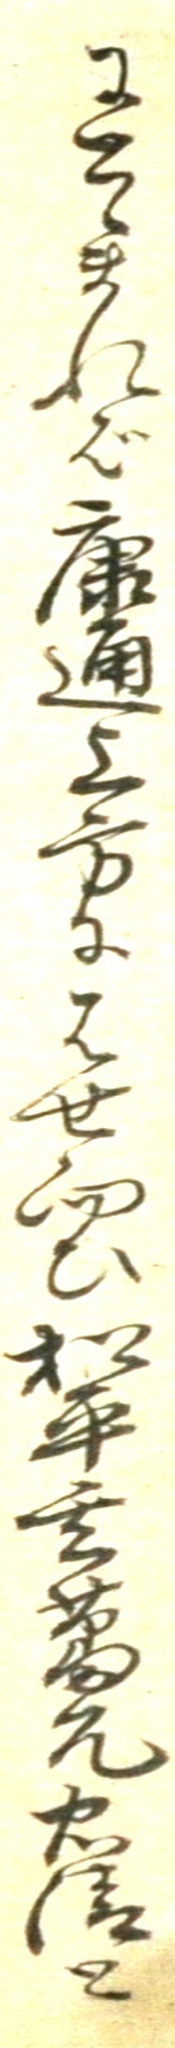にとゝまれば康通上方にはせ向ひ松平玄蕃允忠清と
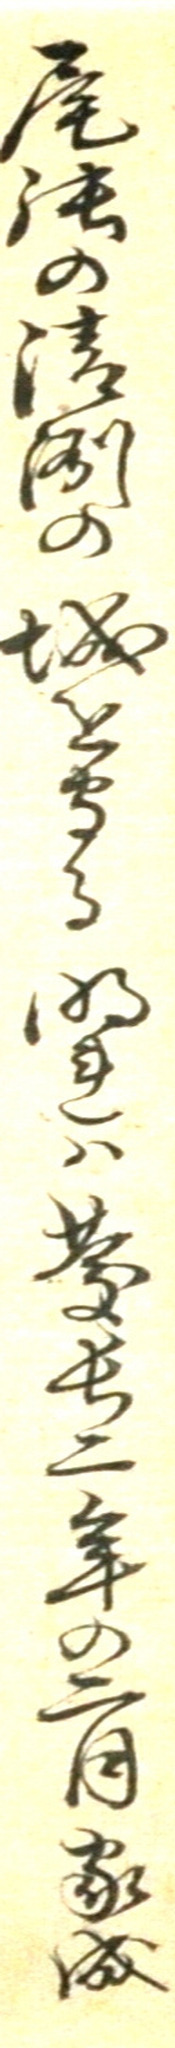尾張の清洲の城を守る明れは慶長二年の二月家成
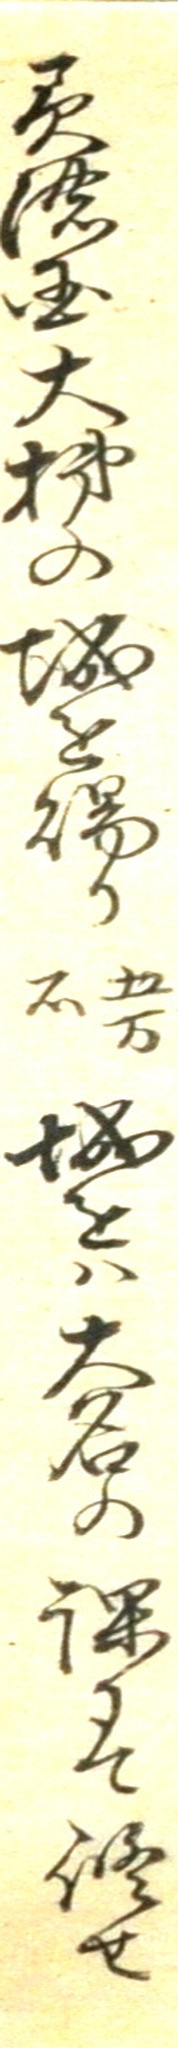美濃国大柿の城を賜り五万石城をは大名の課にて修せ
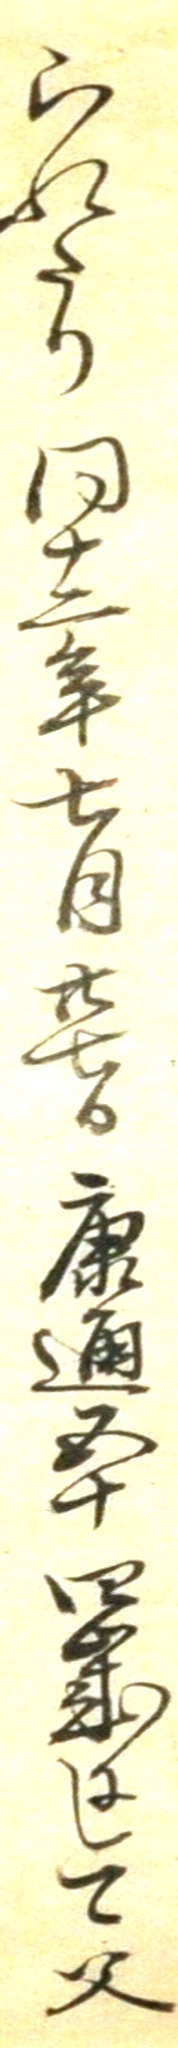られたり同十二年七月廿七日康通五十四歳にして父
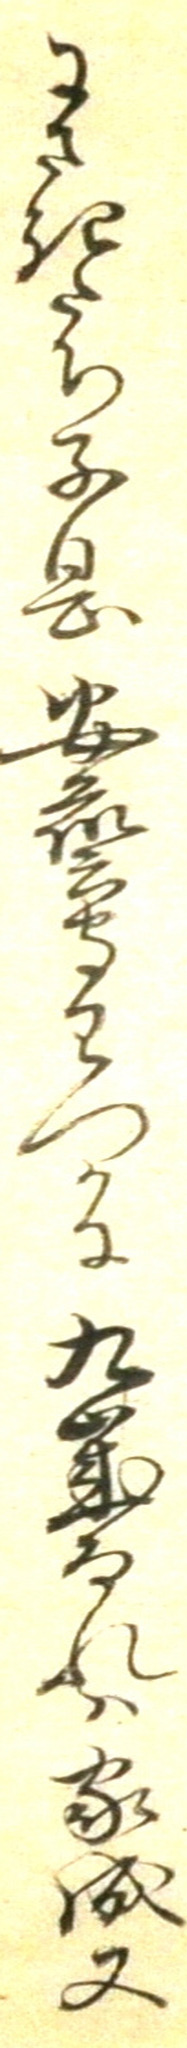にさきたち子息安芸守わつかに九歳なれは家成又
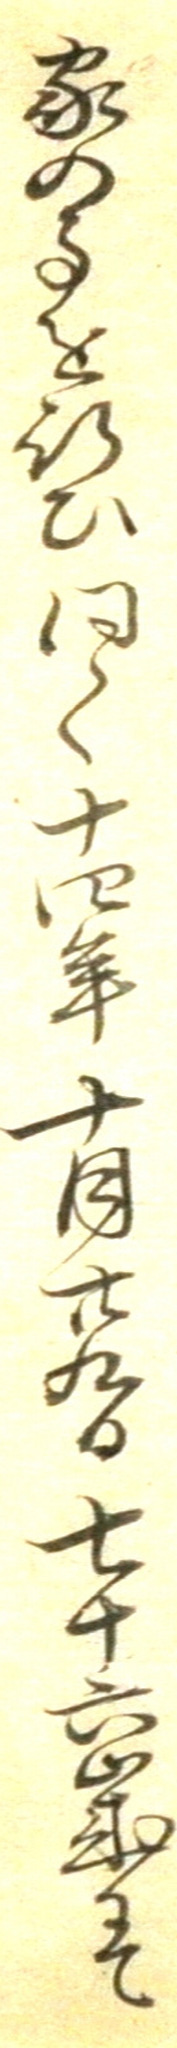家の事を行ひ同く十四年十月廿九日七十六歳にて
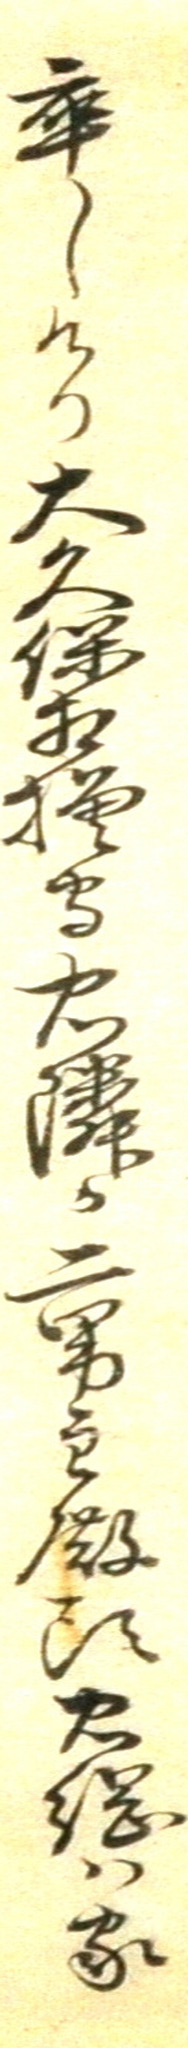卒しけり大久保相模守忠隣か二男主殿頭忠総は家
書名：藩翰譜（四・中）
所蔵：伊那市立高遠町図書館・合同会社AMANE
